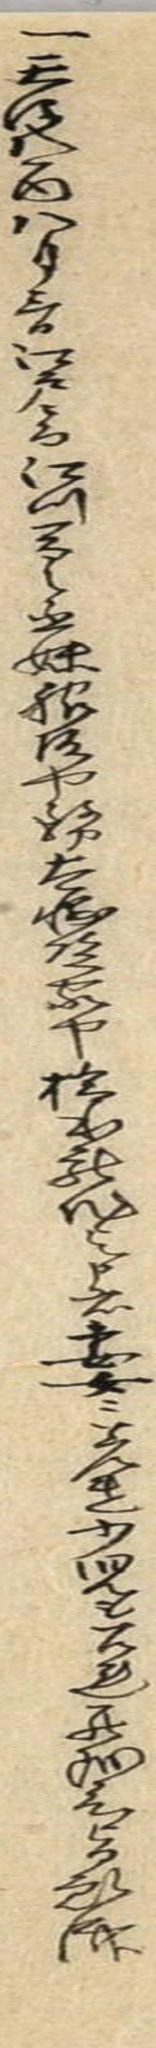一天保八酉八月三日江戸ニ而江川馬之丞妹脇坂中務大輔殿家中橋木新作と申者妻女ニ差遣少児も召連罷越度旨願済
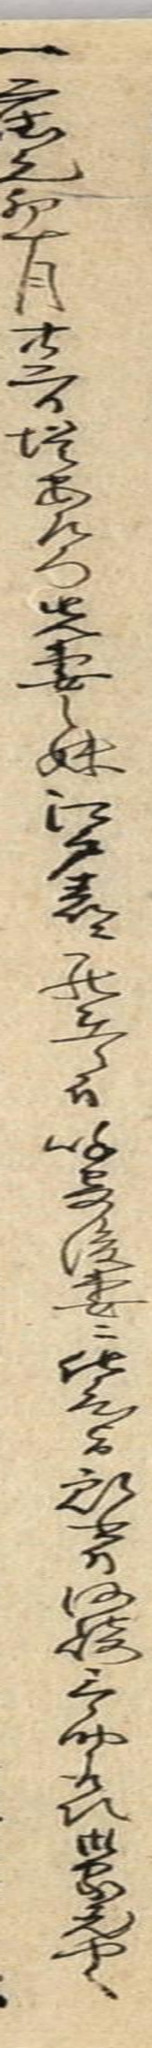一正徳元卯十月廿二日堤安左衛門先妻之妹江戸表ニ罷在候ニ付呼寄後妻ニ仕度旨願書付河崎三郎助取次御家老中へ
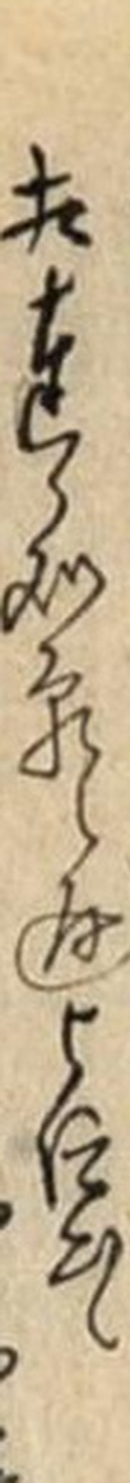相達候処願之通被仰出候
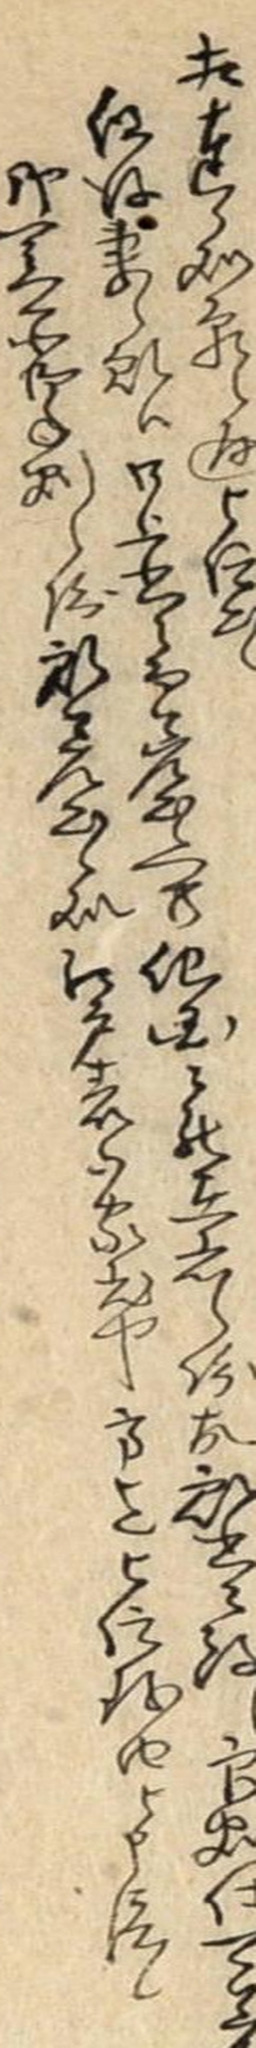御関所御手判之儀願差出候処江戸表御家老中方迄被仰越由被申渡候
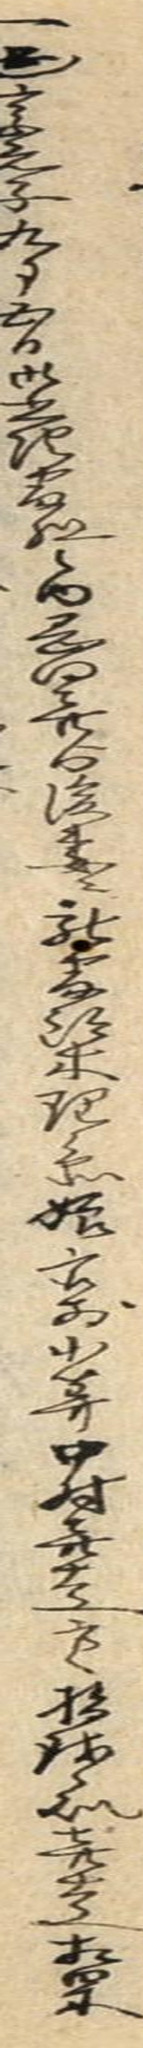一延享元子九月四日御書院番組之内岡田喜右衛門後妻ニ新番鈴木理兵衛娘最前小算中村喜太夫方へ指越候処喜太夫相果
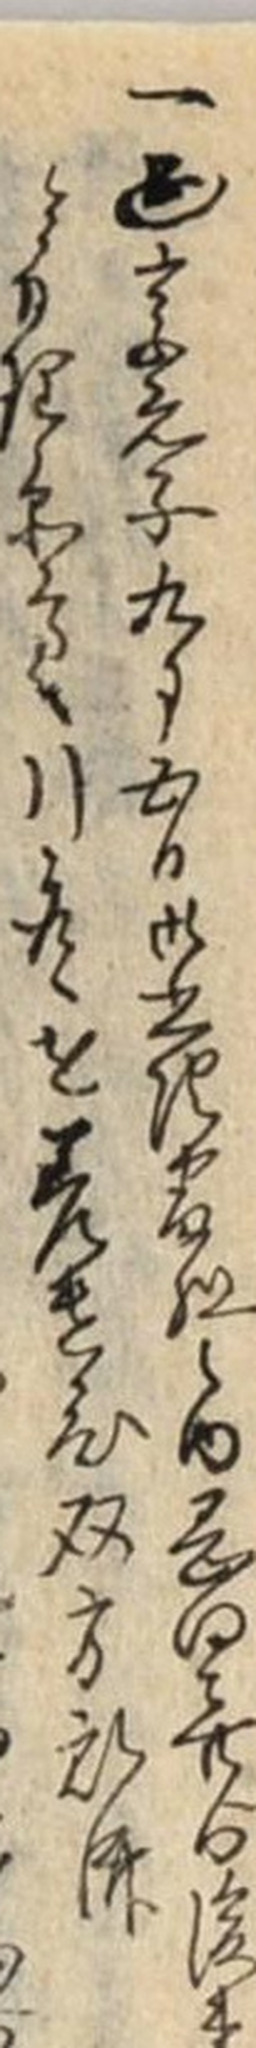候ニ付理兵衛方へ引取候を差遣度双方願済
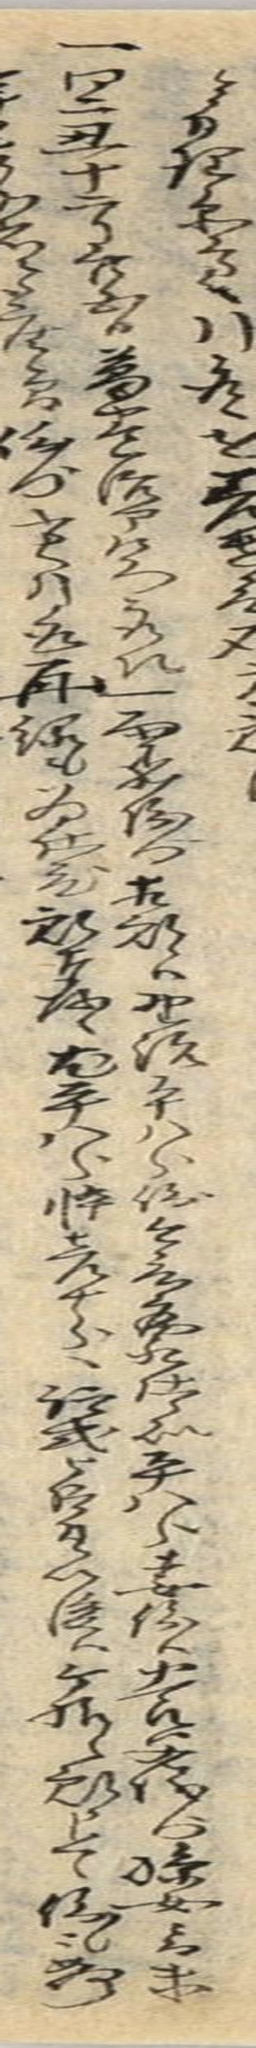年若成者ニ御座候間儀右衛門方へ引取再縁も為仕度願奉存候尤平八郎倅彦十郎へ跡式被仰付候以後ハケ様之願申上候儀も如何
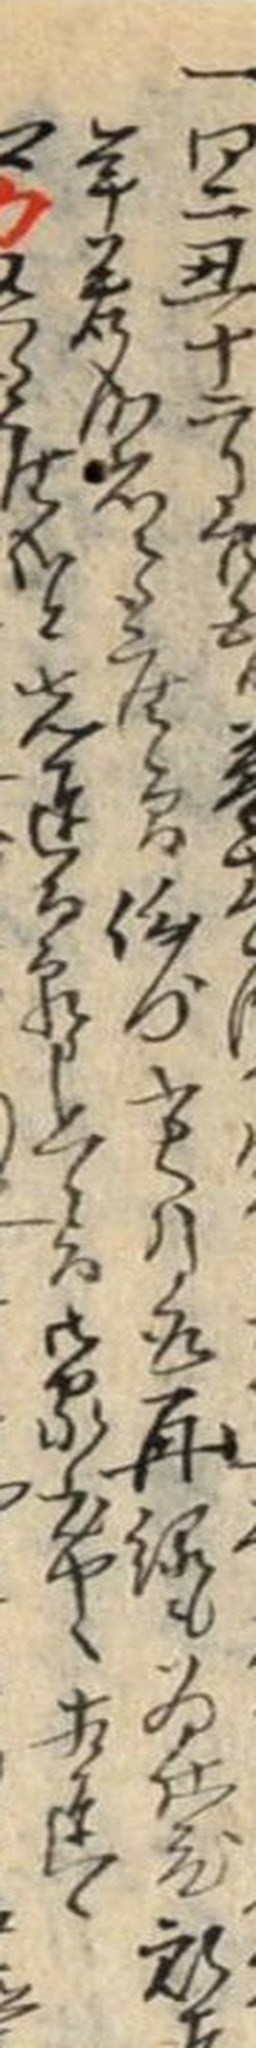可有御座哉と先達而願申上候旨御家老中へ相達候

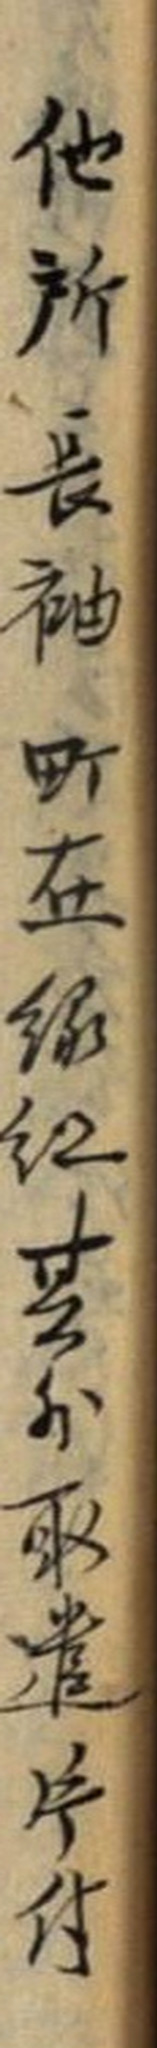他所長袖町在縁組其外取遣片付
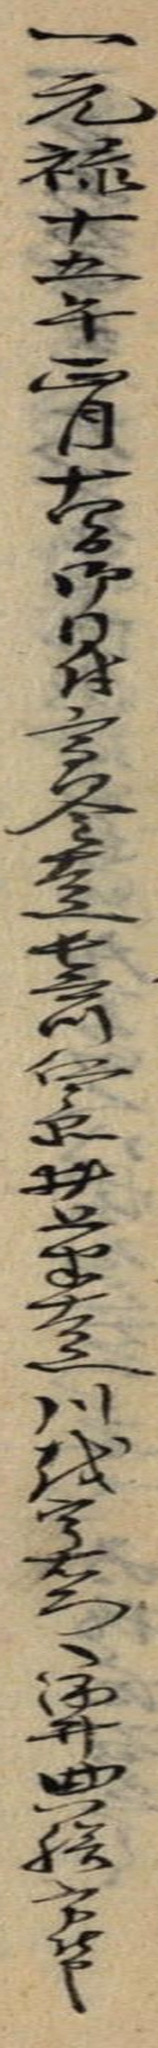一元禄十五午正月十四日御目付高田金太夫長谷川仁兵衛井上半太夫川越宇右衛門へ酒井典膳方被申聞左之通
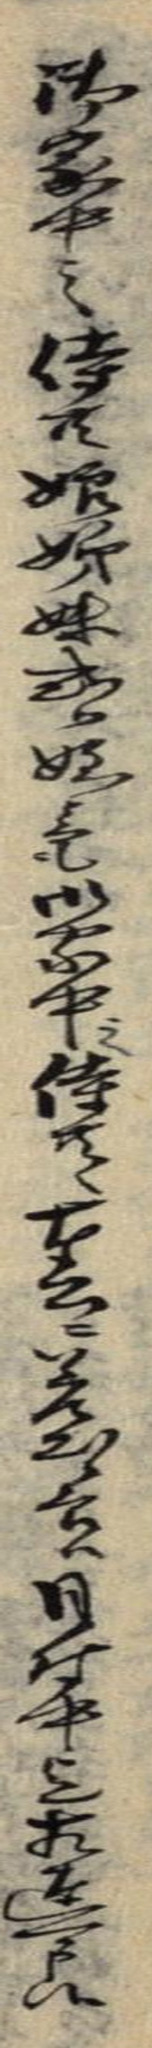御家中之侍共娘姉妹或ハ姪に而も御家中之侍共へ奉公ニ差出候節ハ目付中迄相達可申候
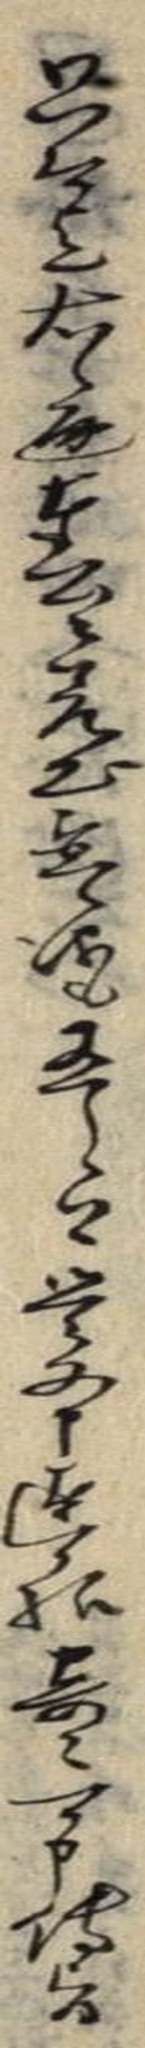只今迄右之通奉公ニ差出置候儀も有之候ハヽ是又申達候様寄々可申伝旨
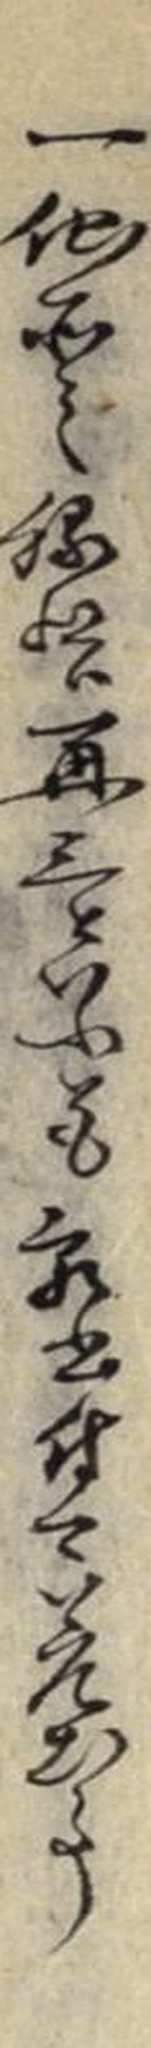一他所之縁組ハ再三といふとも願書付可差出事
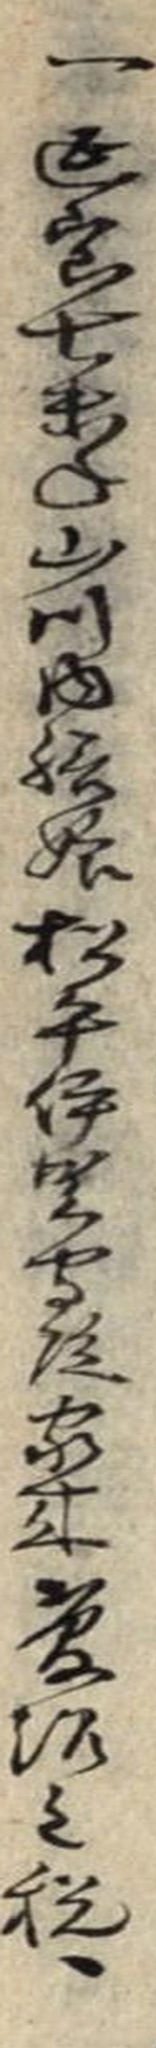一延宝七未年山川内膳娘松平伊賀守殿家来菅沼主税へ
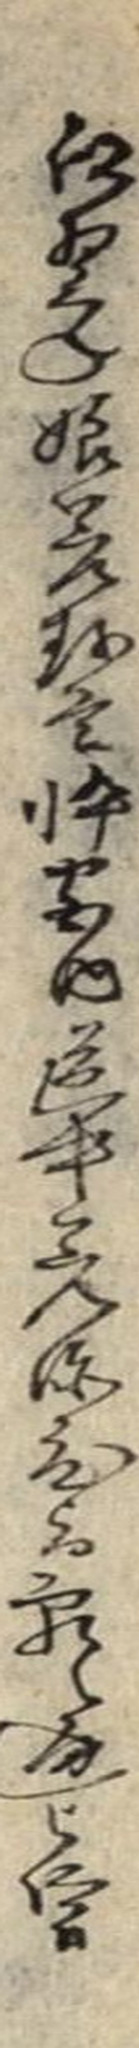但翌年娘差越節倅宮内道中差添度旨願之通被仰付
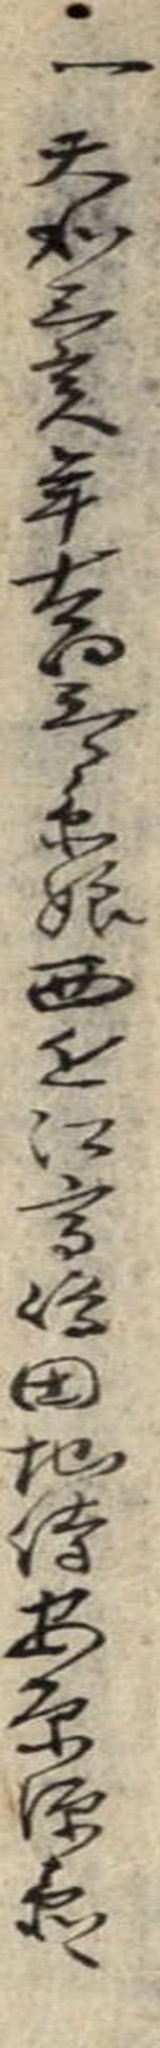一天和三亥年太田三郎兵衛娘西近江高嶋田地侍安原源兵衛へ
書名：養子縁組之部
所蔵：福井県文書館 Fukui Prefectural Archives
